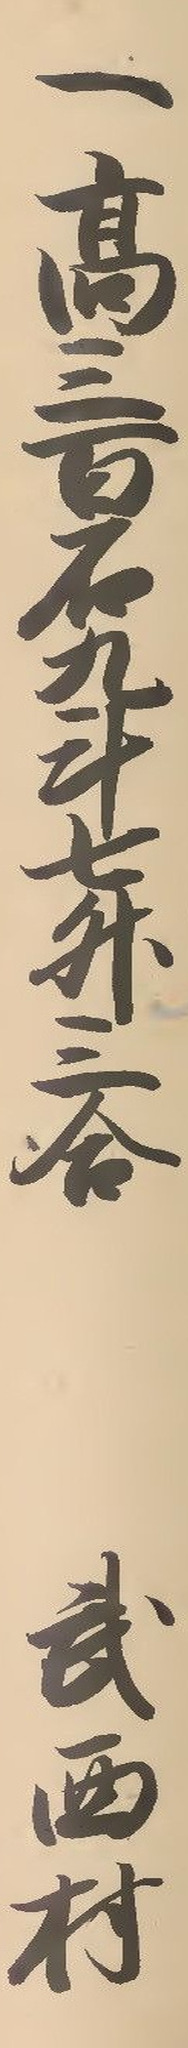一高三百石九斗七升三合武西村
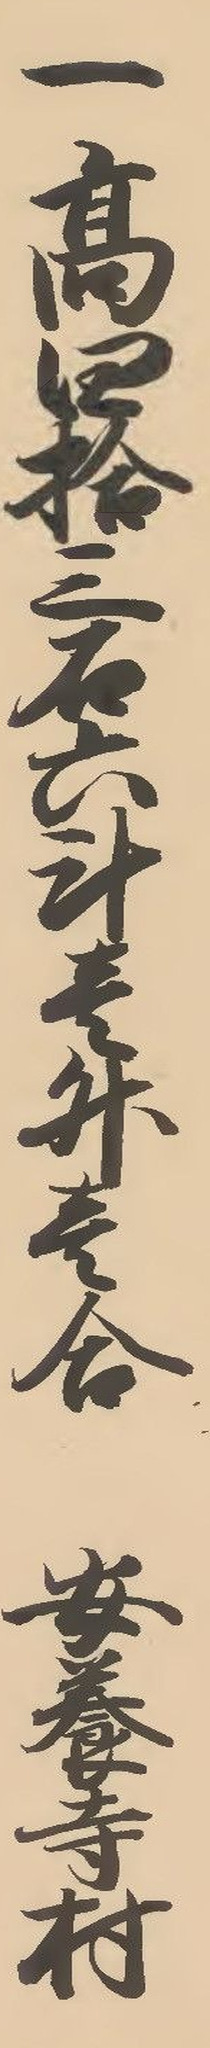一高四拾三石六斗壱升壱合安養寺村
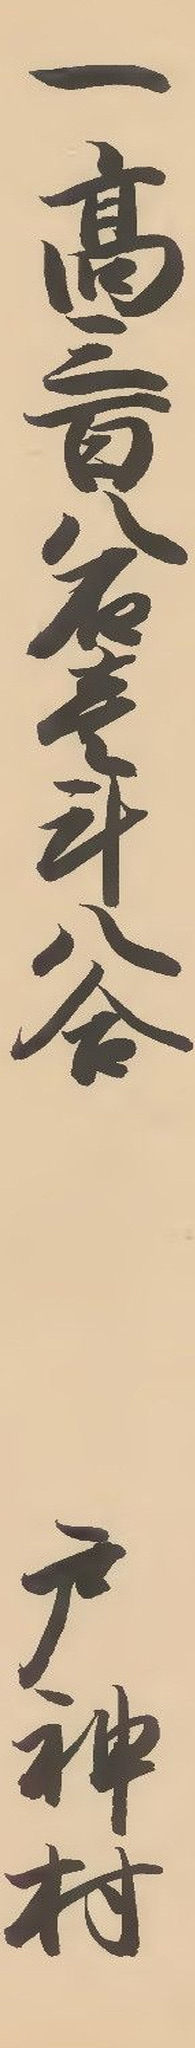一高三百八石壱斗八合戸神村
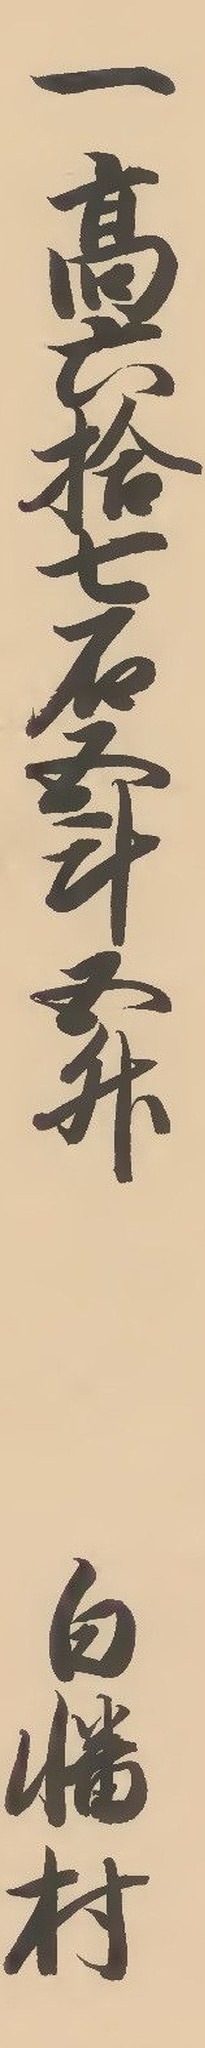一高六拾七石五斗五升白幡村

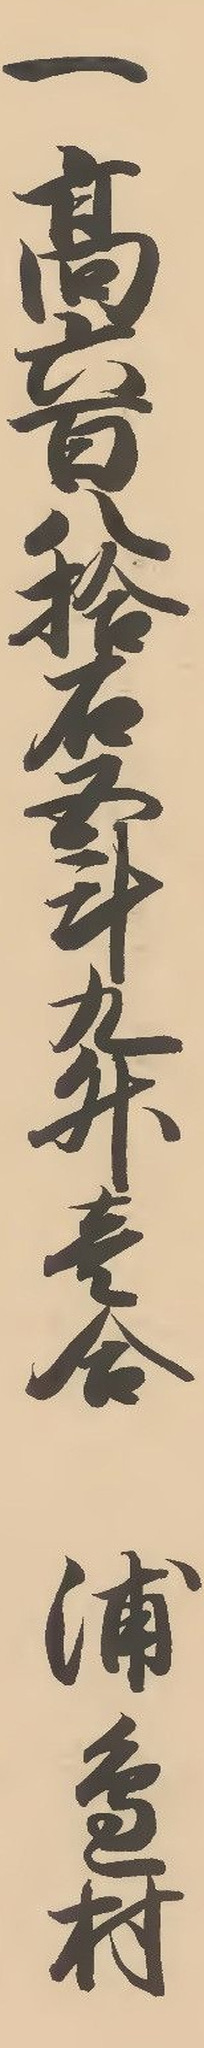一高六百八拾石五斗九升壱合浦辺村
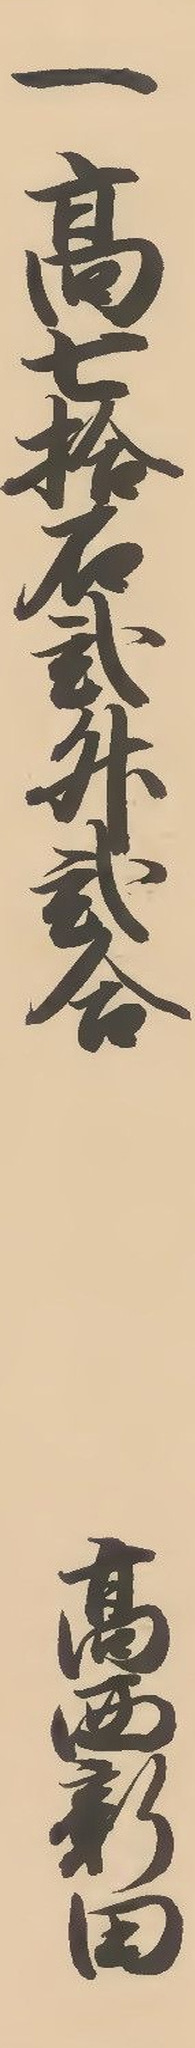一高七拾石弐升弐合高西新田
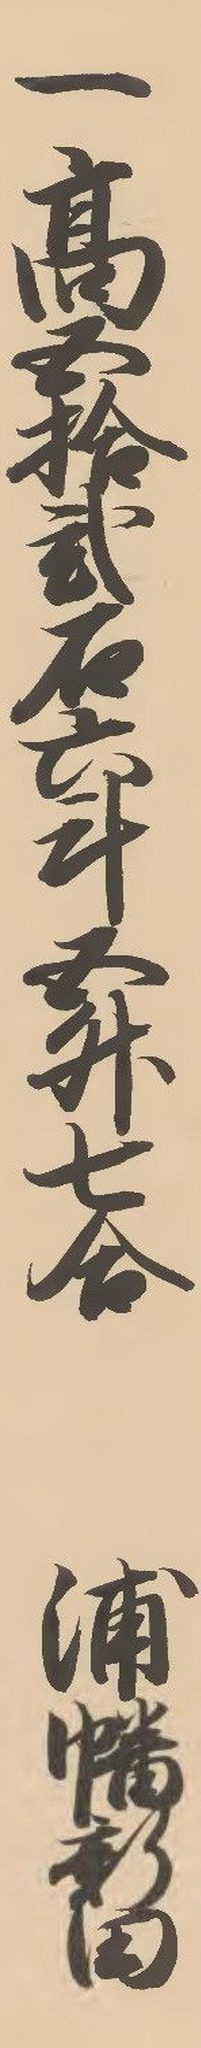一高五拾弐石六斗五升七合浦幡新田
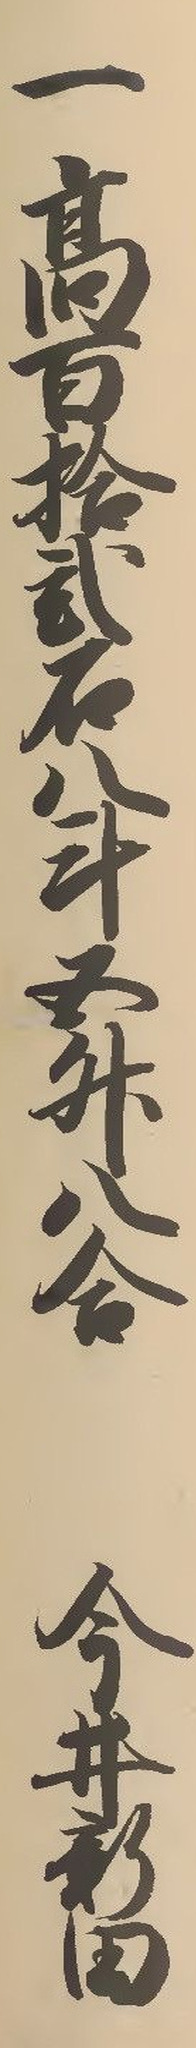一高百拾弐石八斗五升八合今井新田
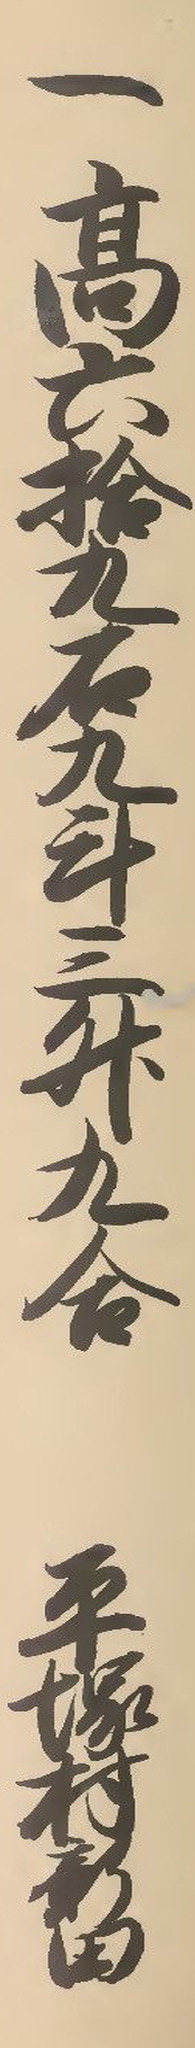一高六拾九石九斗三升九合平塚村新田
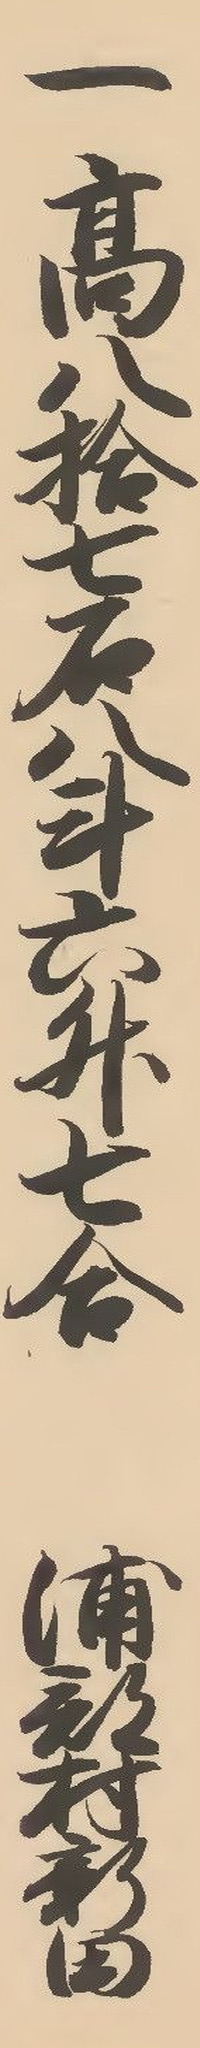一高八拾七石八斗六升七合浦部村新田
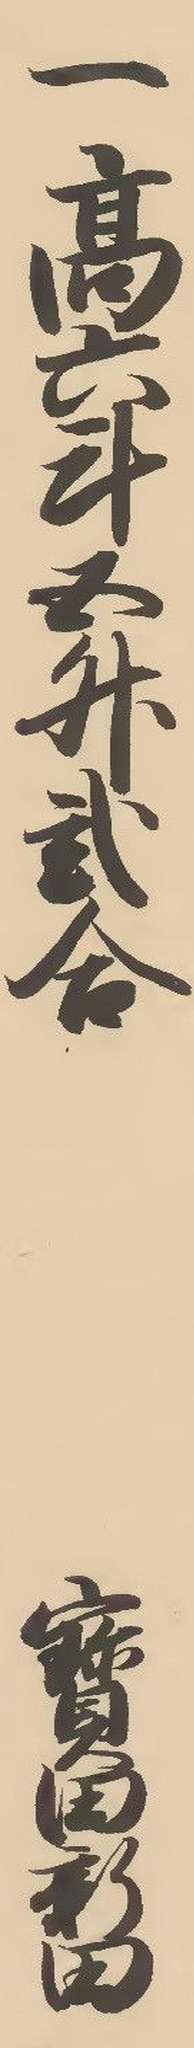一高六斗五升弐合宝田新田
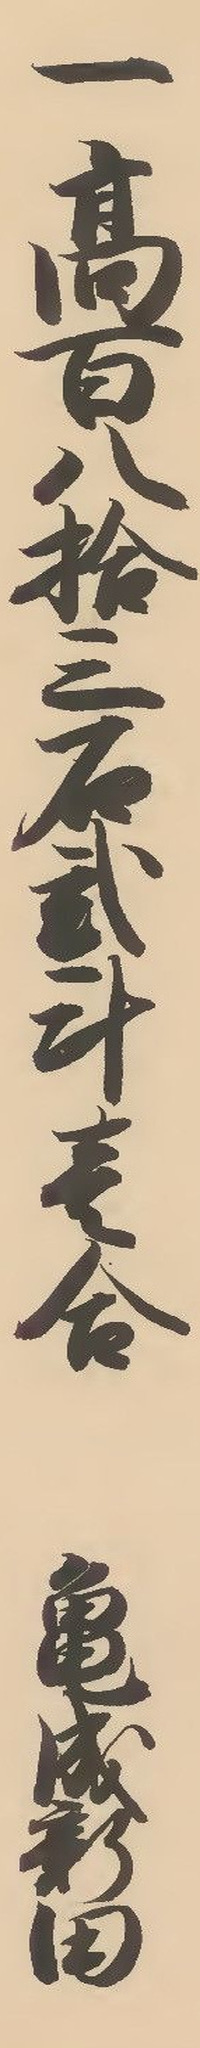一高百八拾三石弐斗壱合亀成新田

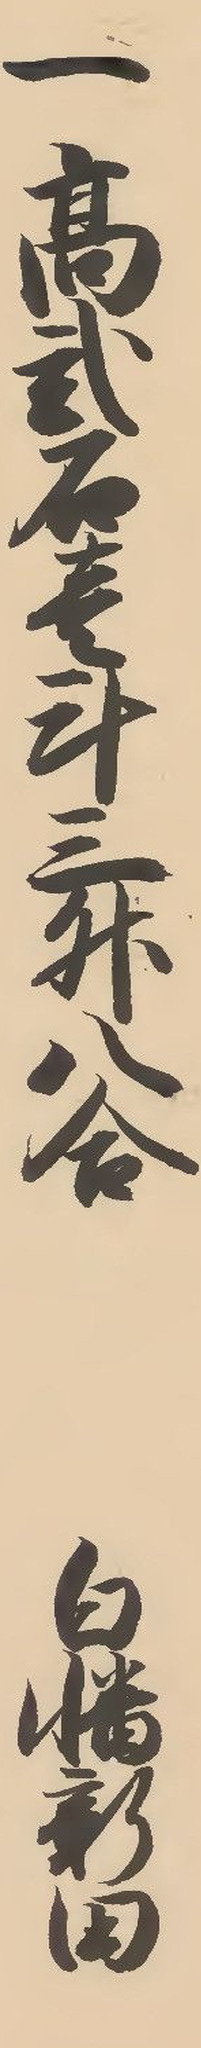一高弐石壱斗三升八合白幡新田
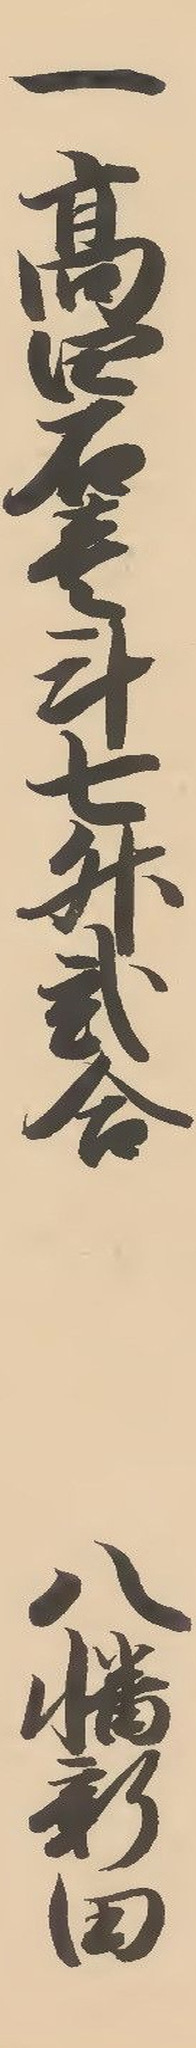一高四石壱斗七升弐合八幡新田
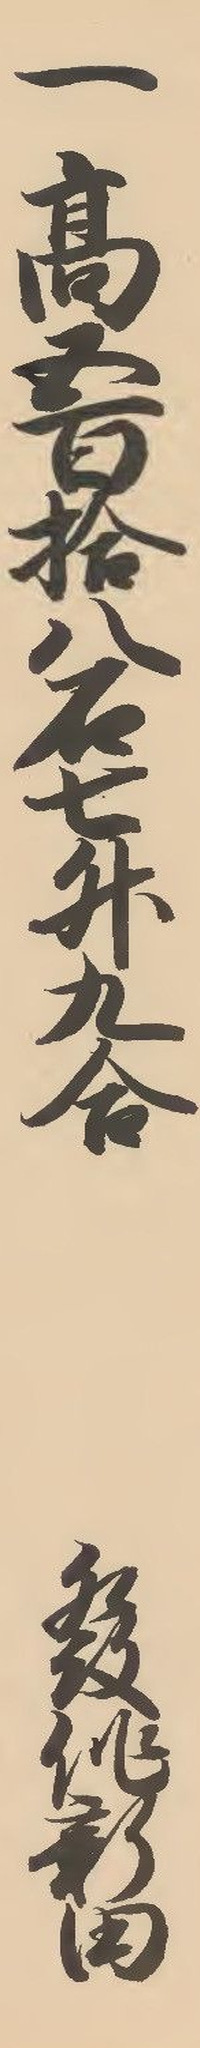一高五百拾八石七升九合発作新田
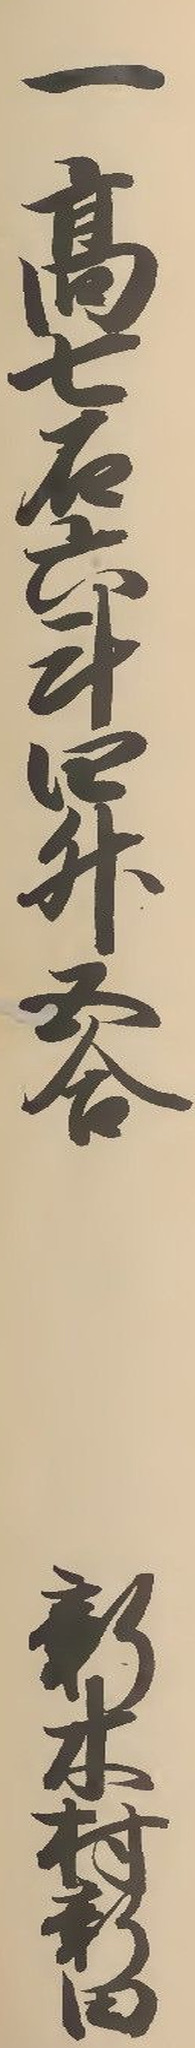一高七石六斗四升五合新木村新田
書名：下総国郷帳
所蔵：国立公文書館 National Archives of Japan
